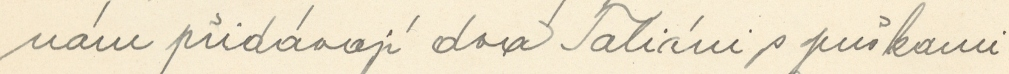nám přidávají dva Taliáni s puškami
